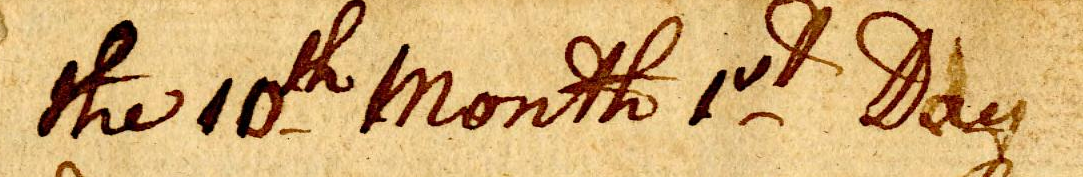the 10^th Month 1^st Day
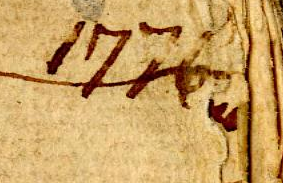1776
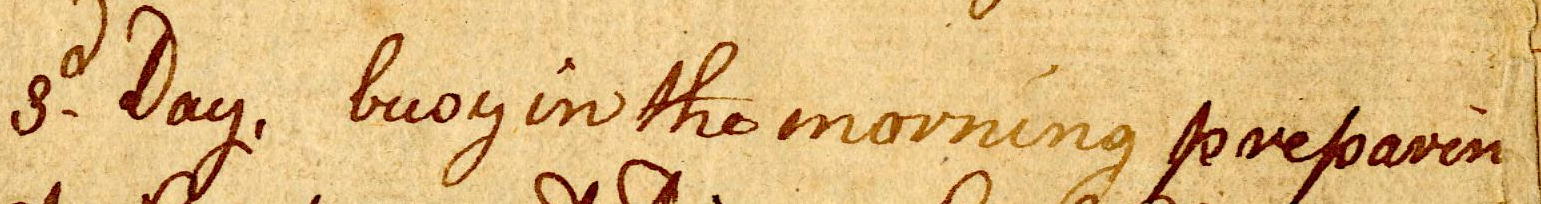3^d Day. busy in the morning preparin
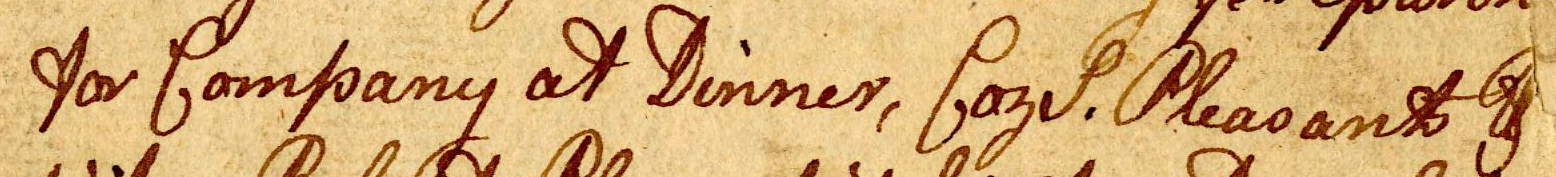for Company at Dinner, Coz S. Pleasants &
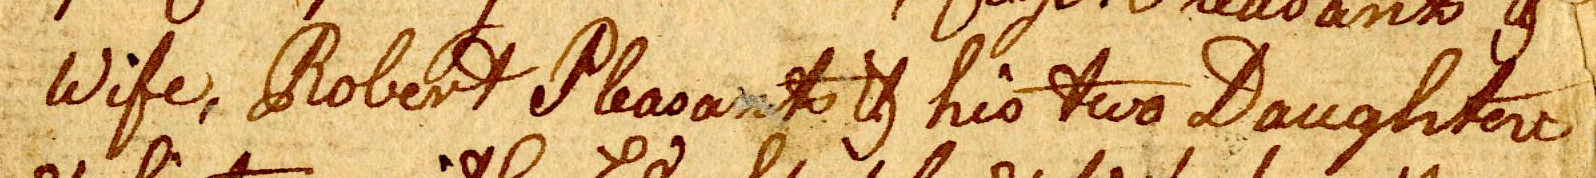Wife, Robert Pleasants & his two Daughters
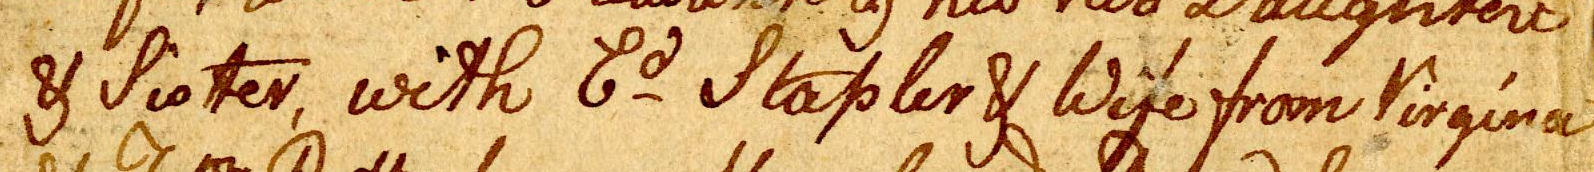& Sister, with E^d Stapler & Wife from Virginia
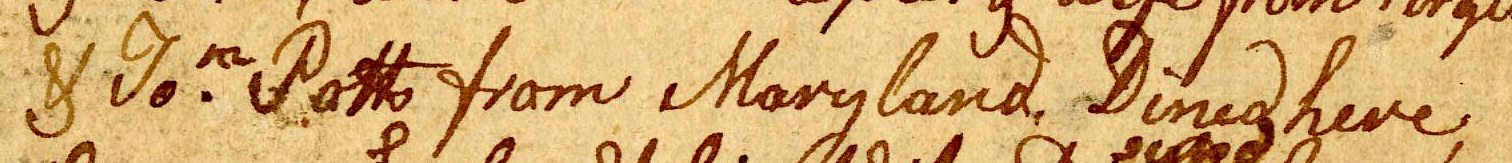& To^m Potts from Maryland. Dined here,
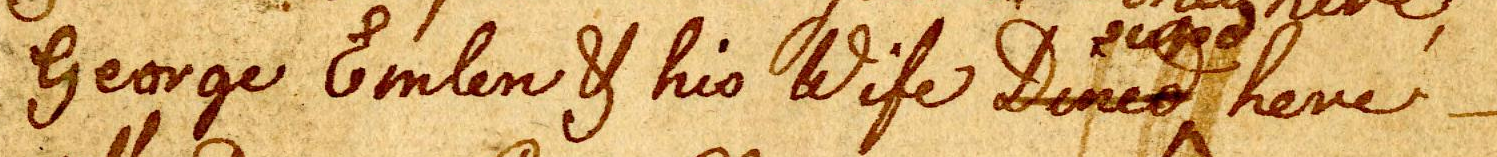George Emlen & his Wife [_____] ^here-
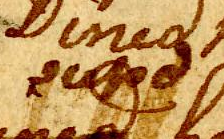supd
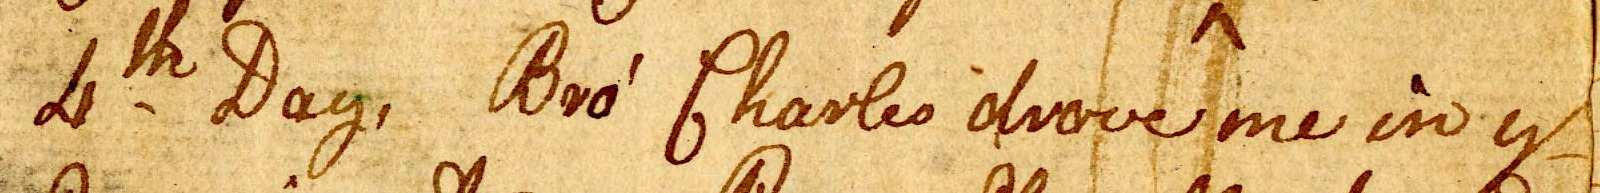4^th Day. Bro' Charles drove me in y
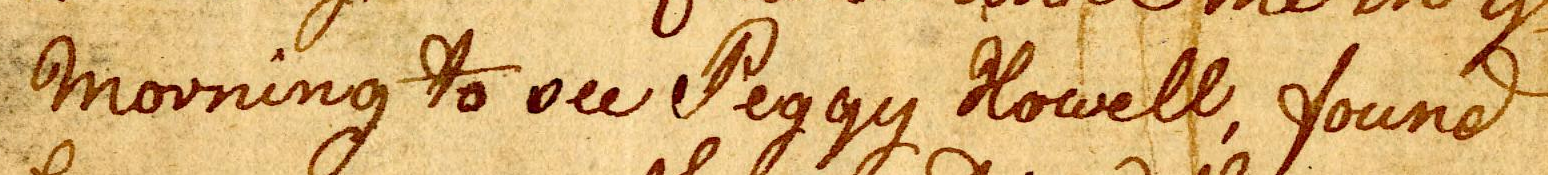Morning to see Peggy Howell, found
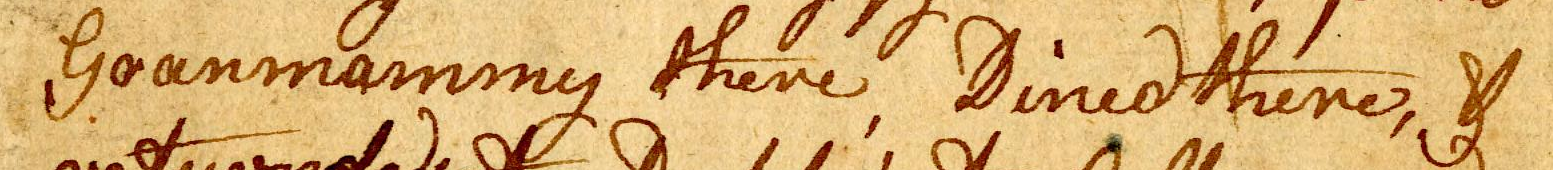Granmammy there, Dined there, &
